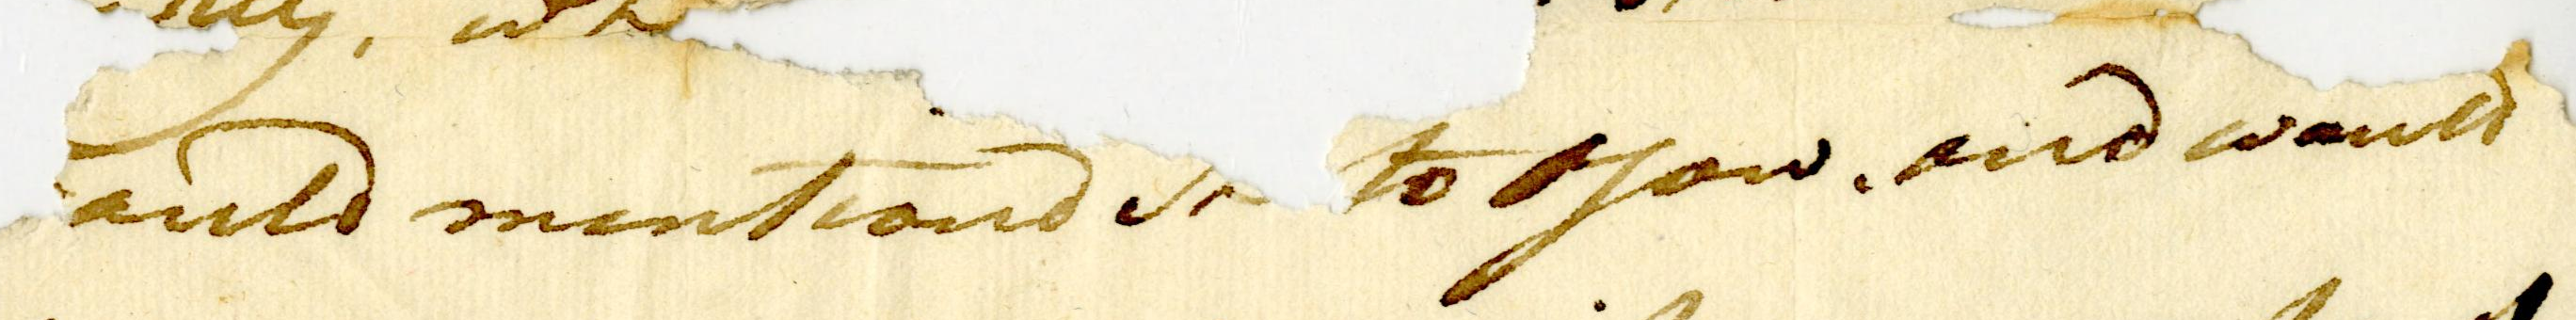[_]ould mentiond it to you, and would
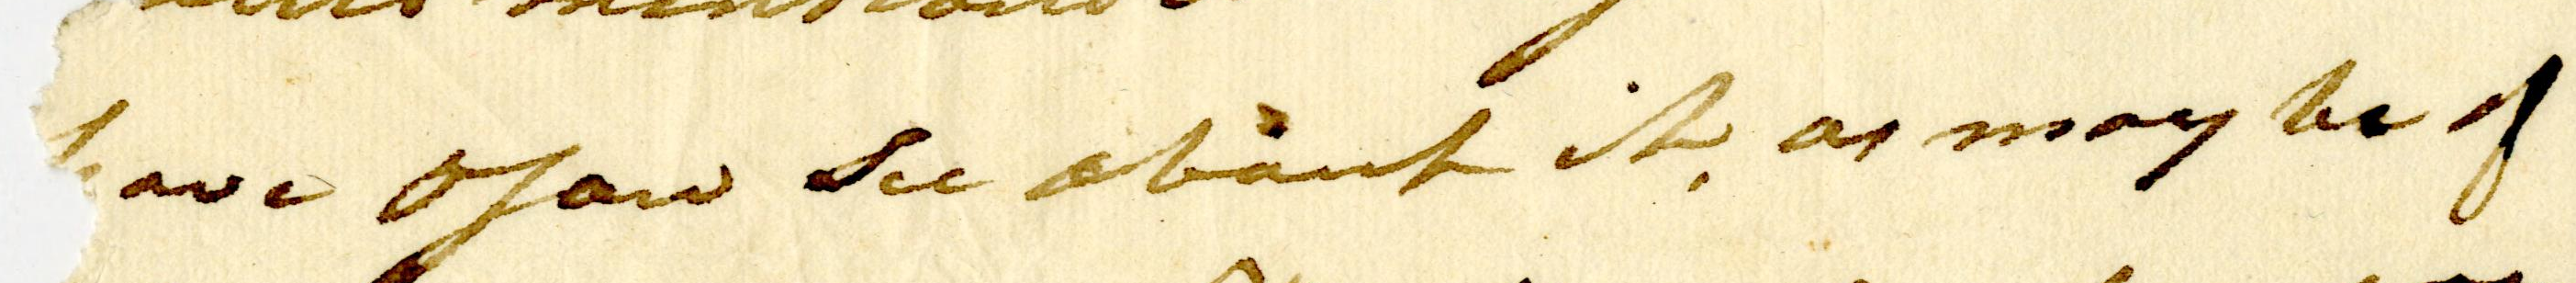have you see about it, as may be of
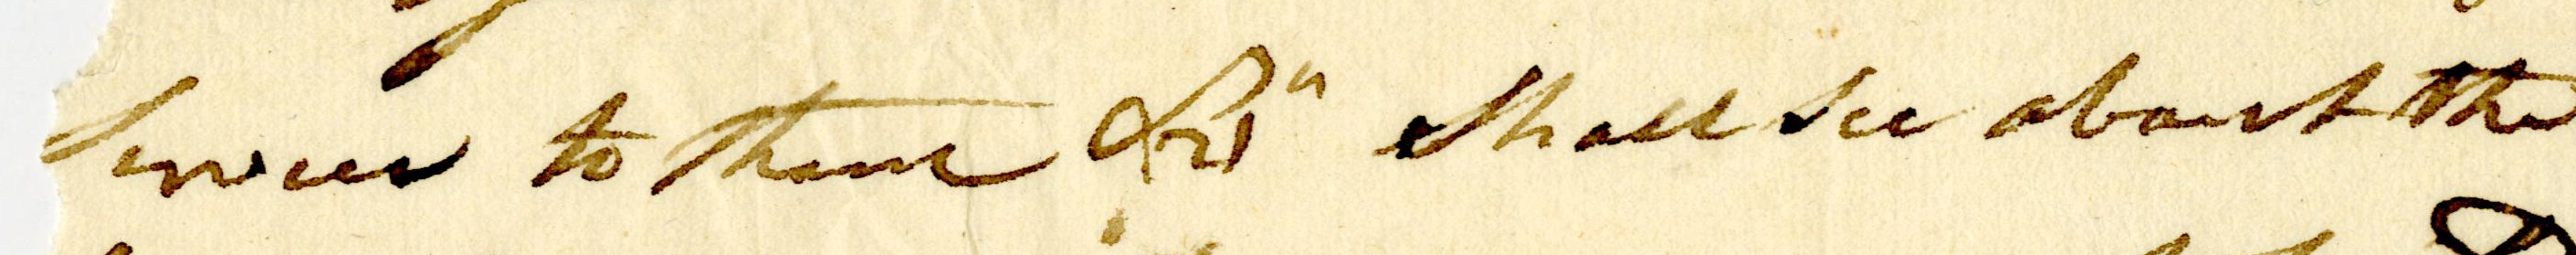service to them &c^a shall see about the
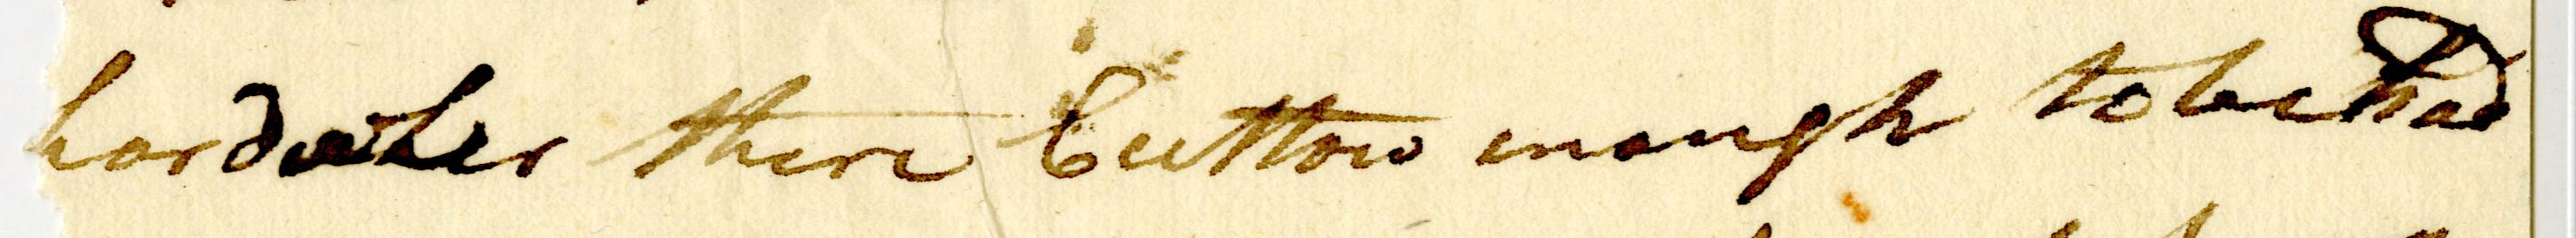hardother there Cotton enough to be had
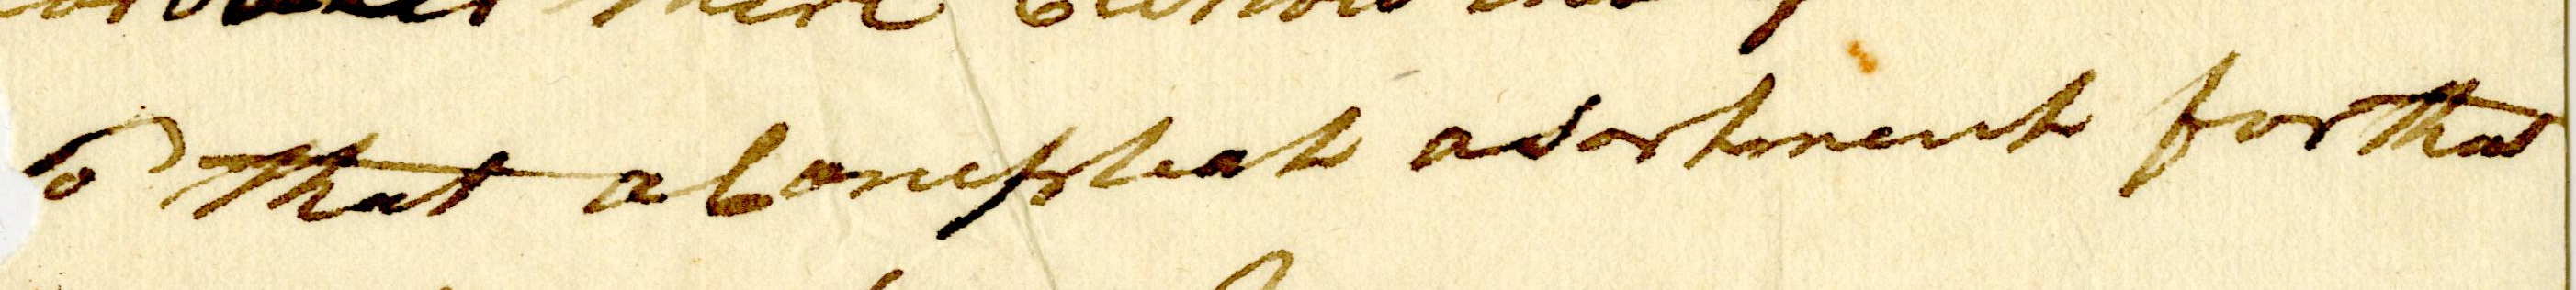so that a Compleat assortment for that
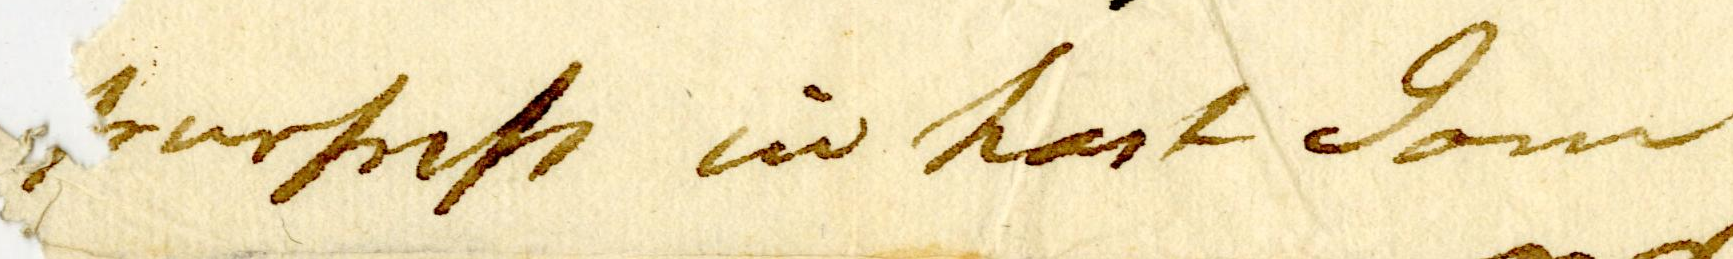purpos in hast I am
